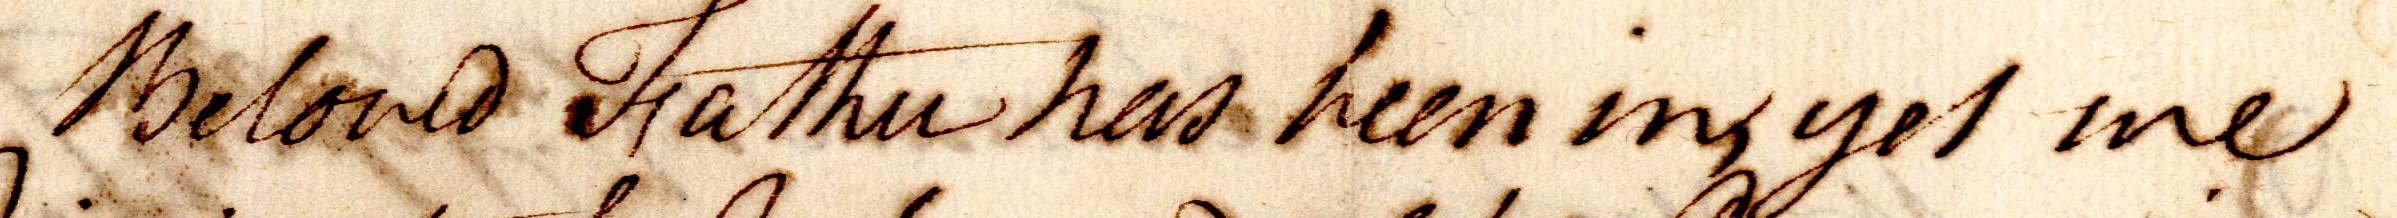Beloved Father has been in, yet we
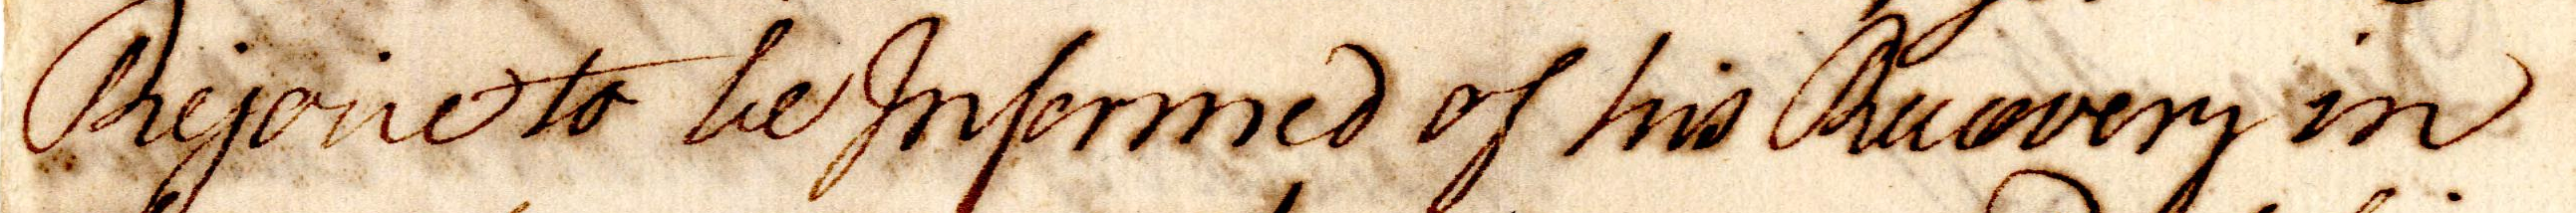Rejoice to be Informed of his Recovery in
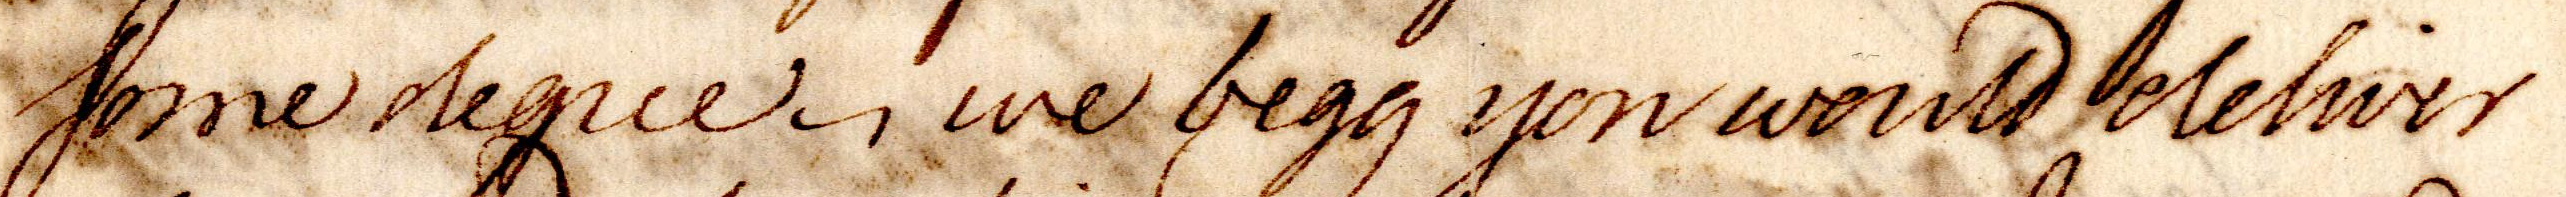some degree. we begg you would deliver
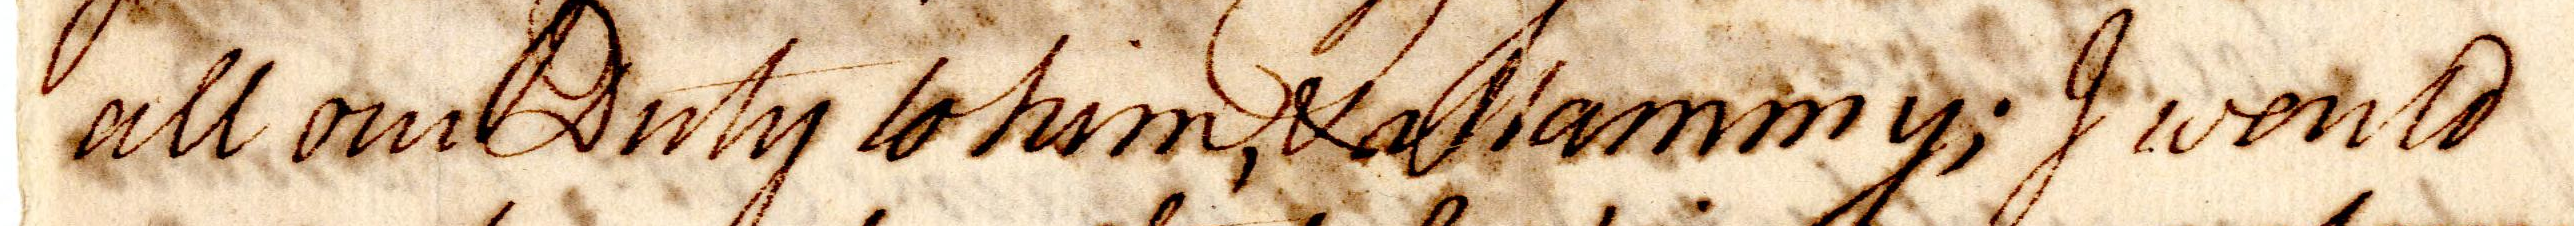all our Duty to him, & Mammy; I would
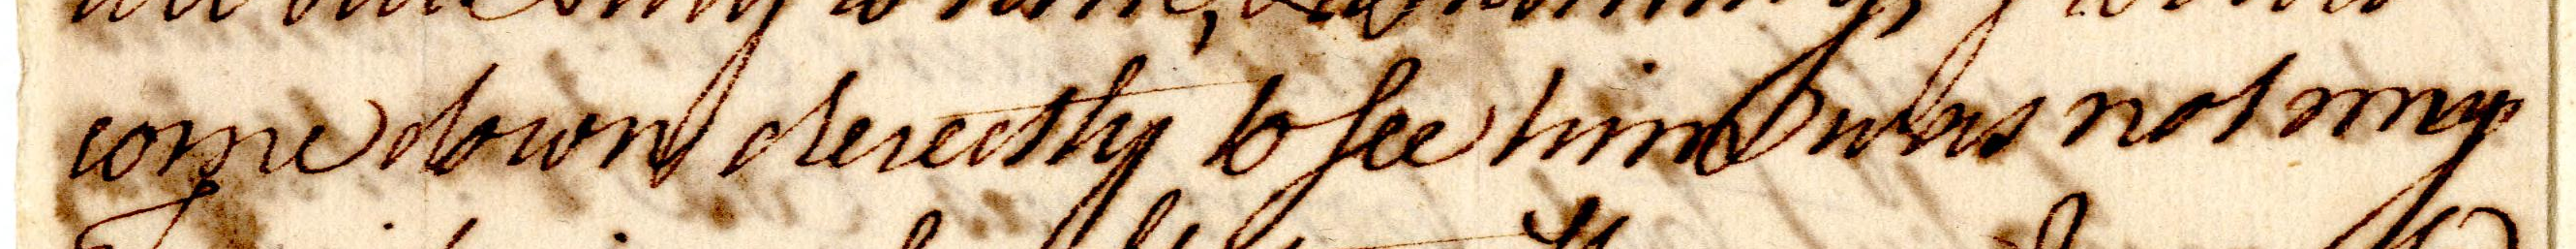come down directly to see him & was not my
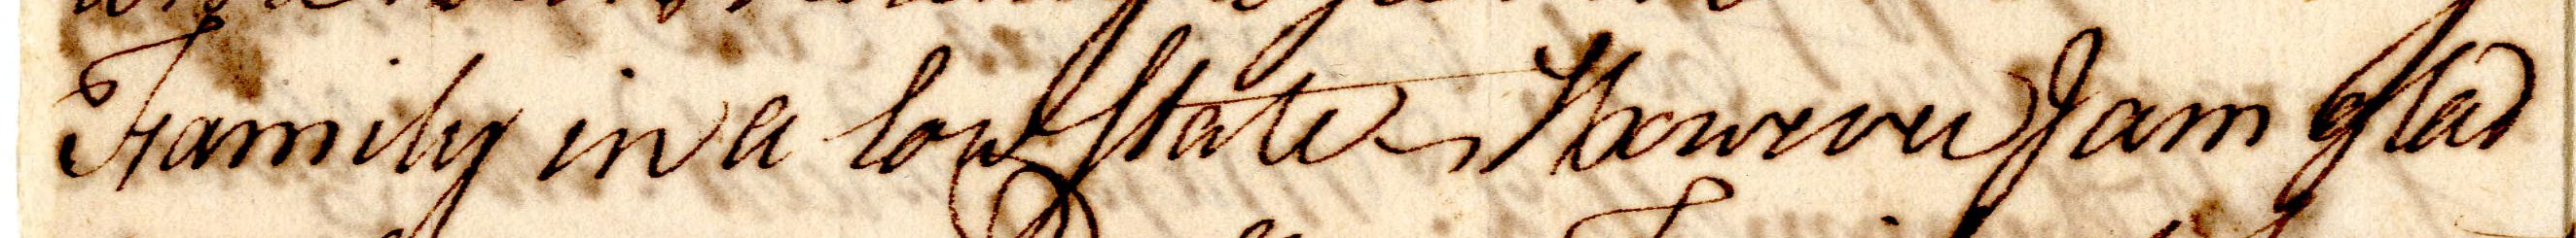Family in a low state. However I am glad
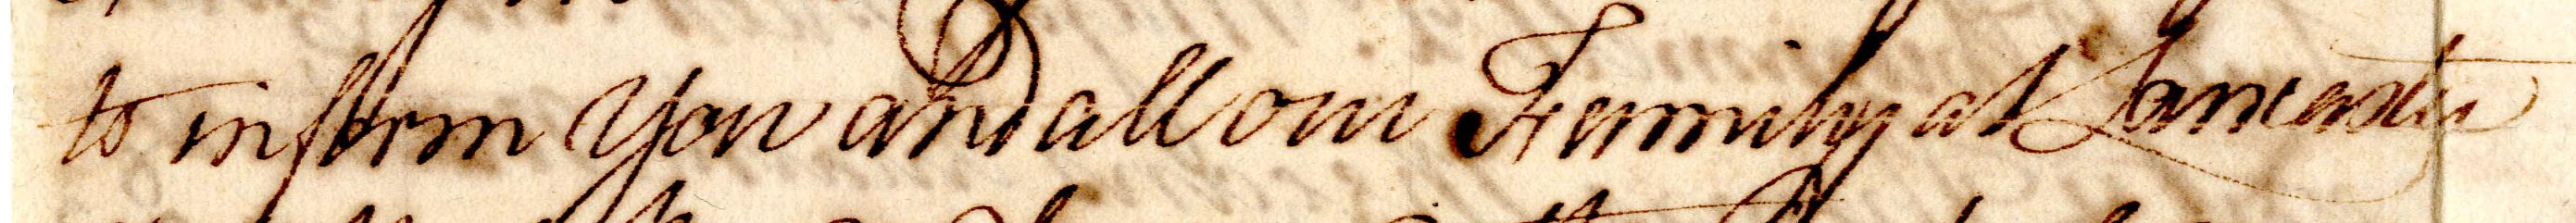to inform You and all our Family at Lancaster
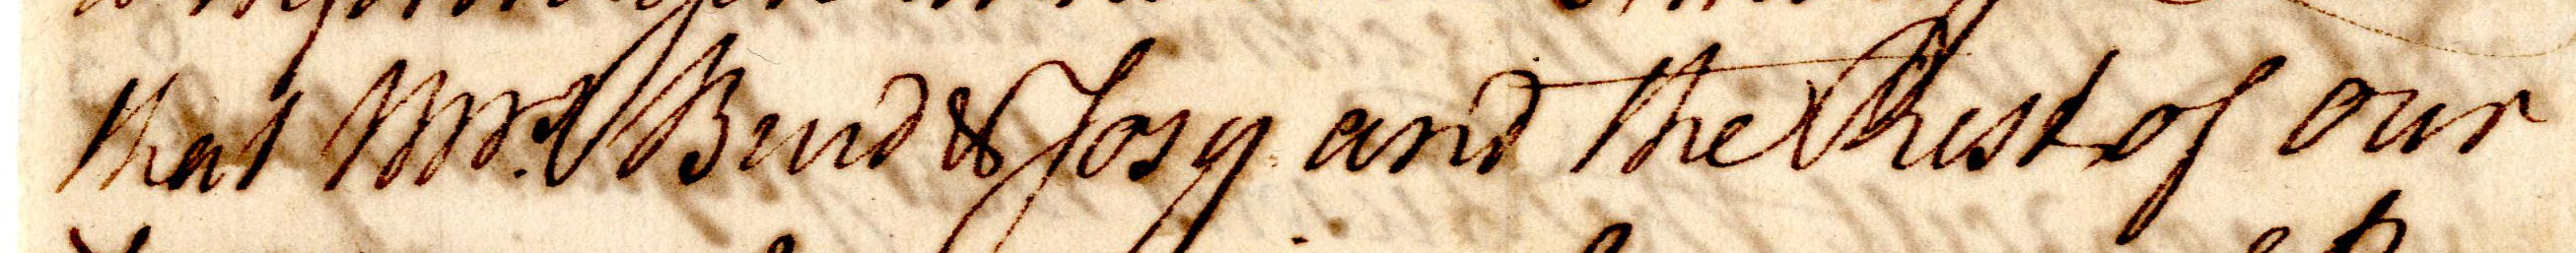that M^rs Burd & Josy and the Rest of our
